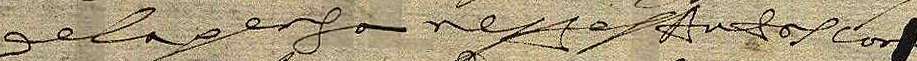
de la penha nestes Autos com
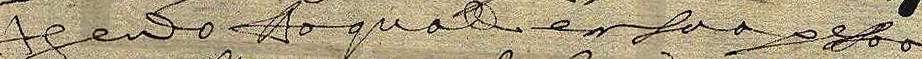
theudo Ao quall em sua pessoa
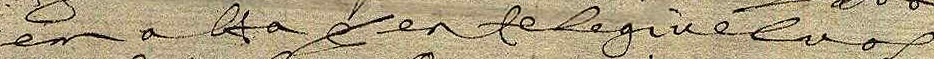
em alta e entelegivel vos
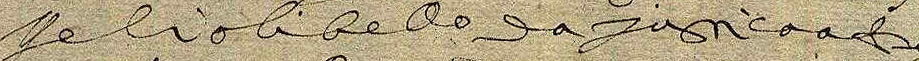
lhe li o libello da Justica atras
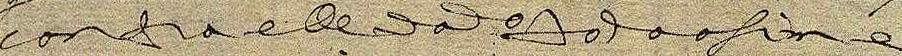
contra elle dado todo assim e
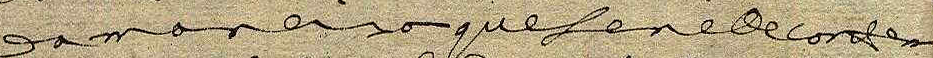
da maneira que se nelle contem
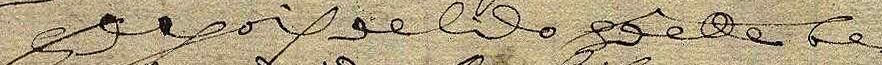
e depois de lido e delle bem
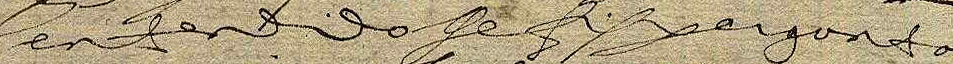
entendido lhe foi pergunta_
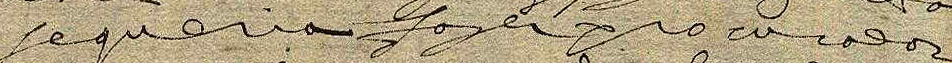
se queria fazer procurador
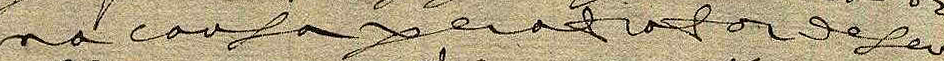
na causa pera tratar de seu
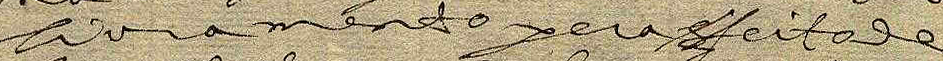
livramento pera effeito de
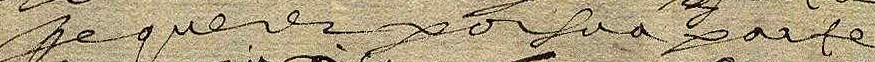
requerer por sua parte
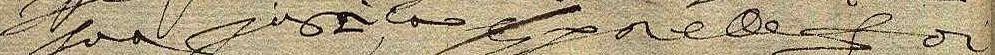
sua Justiça e por elle foi
